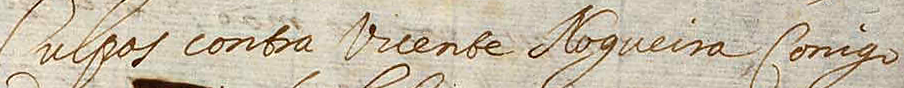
Culpas contra Vicente Nogueira Conigo
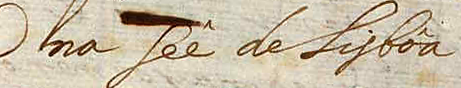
na Seê de Lisbôa
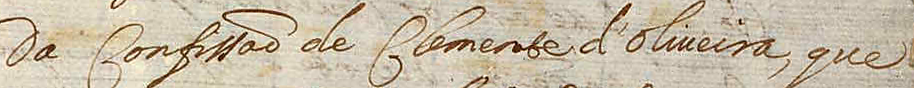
da Confissão de Clemente d´Oliveira, que
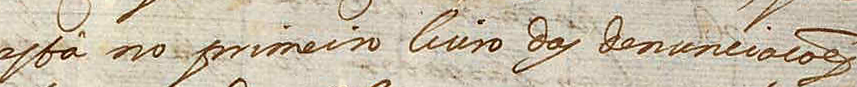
estâ no primeiro livro das denunciações
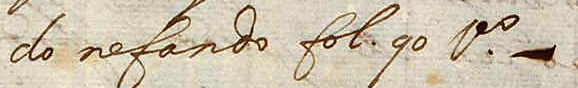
do nefando fol. 90 v
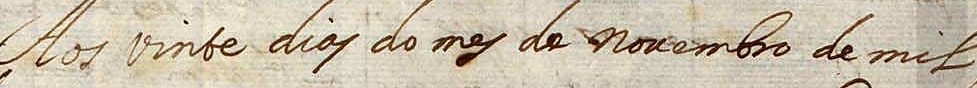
Aos vinte dias do mes de novembro de mil,
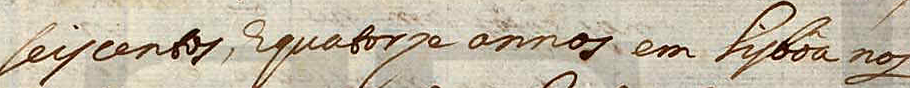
seiscentos, e quatorze annos em Lisbõa nos
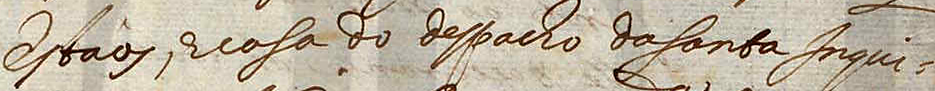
estaôs, e casa do despacho da Santa Inqui
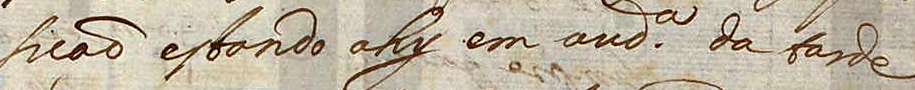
sição estando ahy em aud.a da tarde
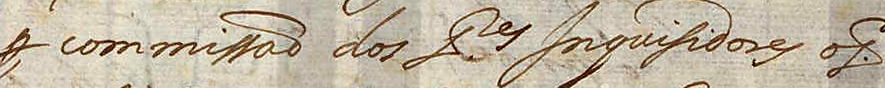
per commissão dos S.res Inquisidores o S.or
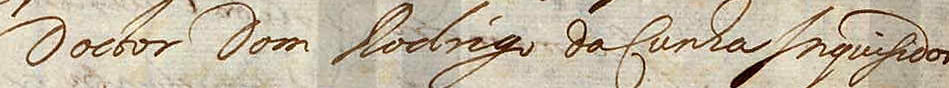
Doctor Dom Rodrigo da Cunha Inquisidor
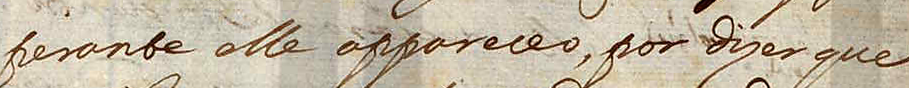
perante elle appareceo, por dizer que
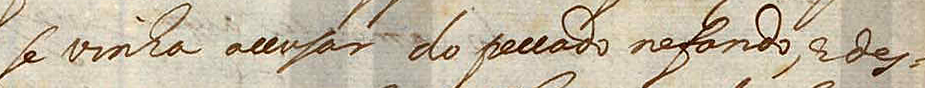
se vinha occupar do peccado nefando, e des-
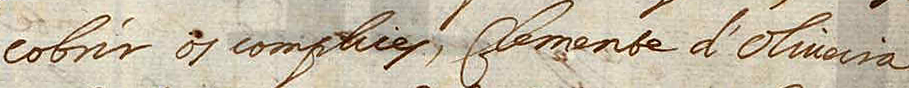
cobrir os complices, Clemente d´Oliveira
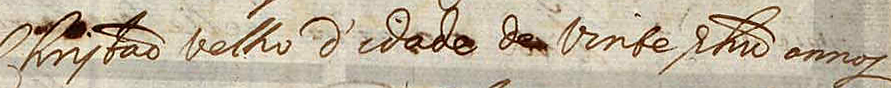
Christão Velho d´edade de vinte e hū annos
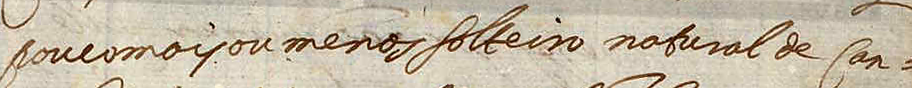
pouco mais ou menos solteiro natural de Can-
